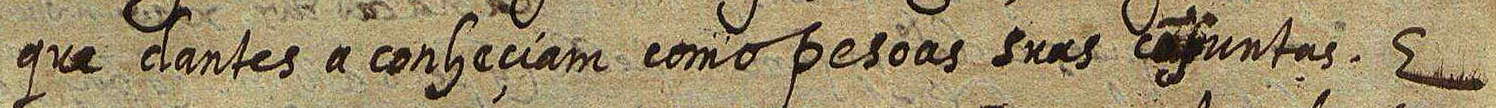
que dantes a conheçiam como pesoas suas cōjuntas. E
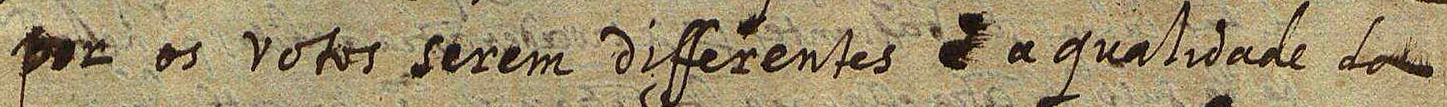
por os votos serem differentes e a qualidade da
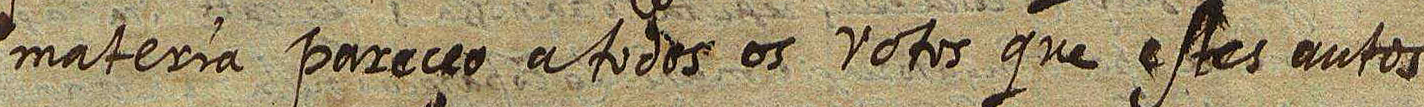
materia pareçeo a todos os votos que estes autos
